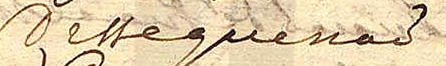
Disse que naõ
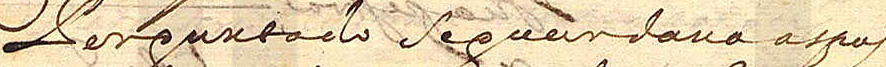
Perguntado se guardaua as pas
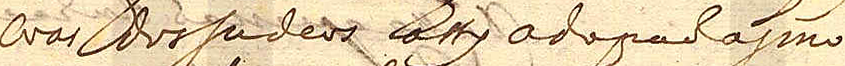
coas dos Judeos assy a do paõ asmo
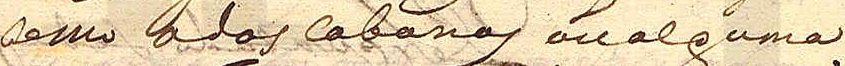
como a das cabanas, ou alguma
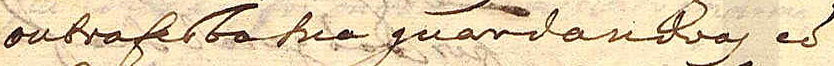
outra festa sua guardandoas cō
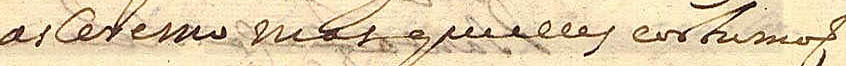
as ceremonias que elles costumaõ
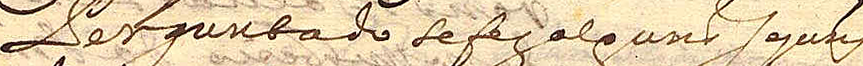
Perguntado se fez alguns Jejuns
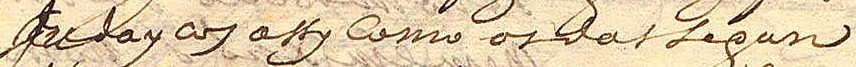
Judaycos assy como os das segun
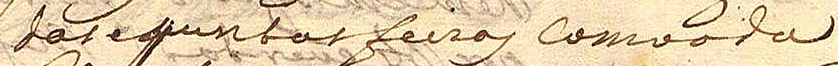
das e quintas feiras como o da
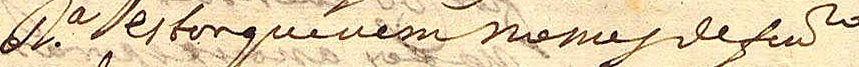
R.a ester que uem no mes de feuro
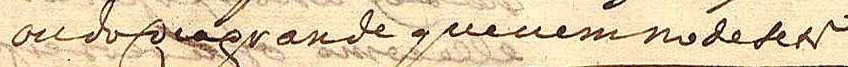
ou do dia grande que uem no de setro
